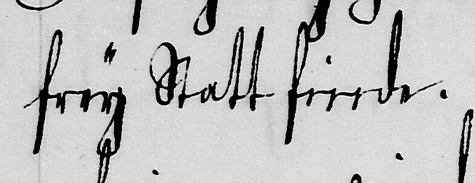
frey Statt finde.
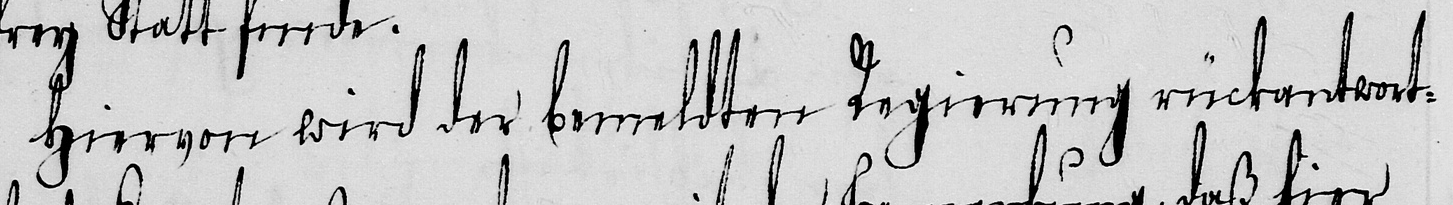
Hiervon wird der bemeldten Regierung rückantwort¬
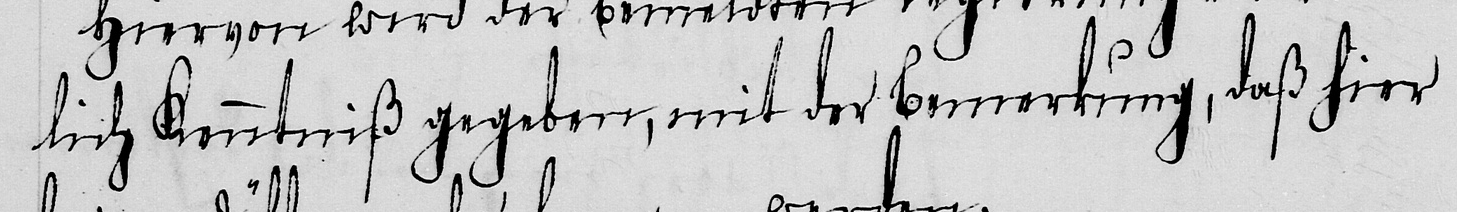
lich Kenntniß gegeben, mit der Bemerkung, daß hier
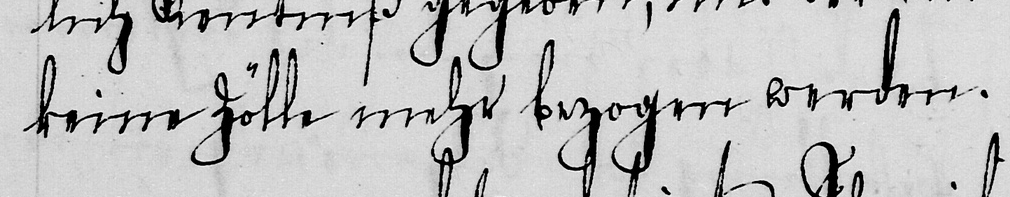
keine Zölle mehr bezogen werden.
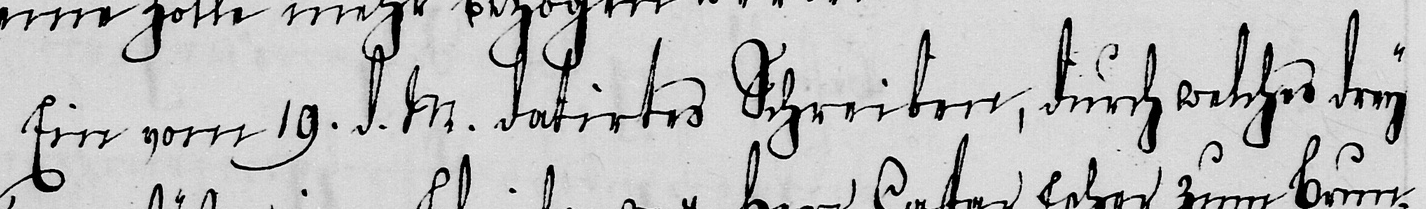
Ein vom 19. d. M. datirtes Schreiben, durch welches drey
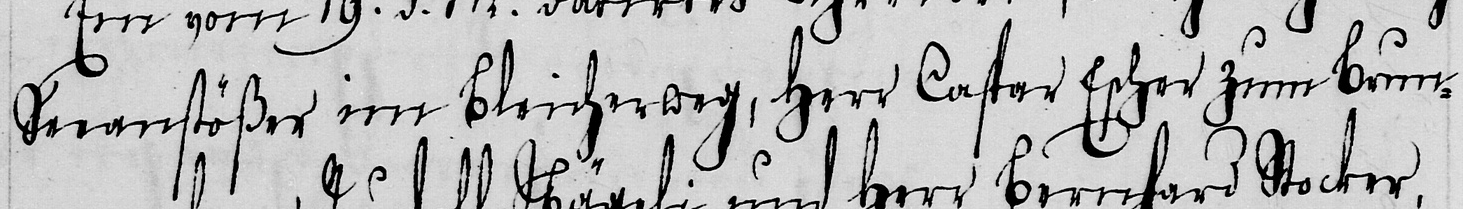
Seeanstößer im Bleicherweg, Herr Caspar Escher zum Brun¬
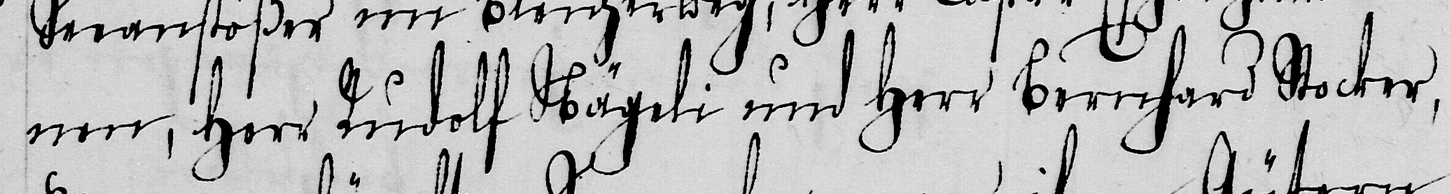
nen, Herr Rudolf Nägeli und Herr Bernhard Stocker,
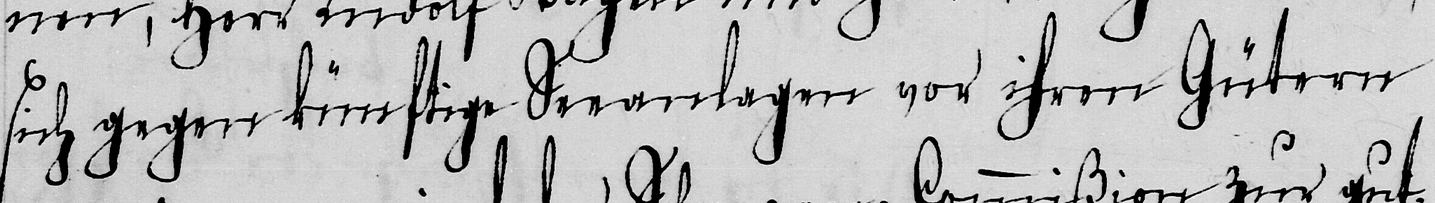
sich gegen künftige Seeanlagen vor ihren Gütern
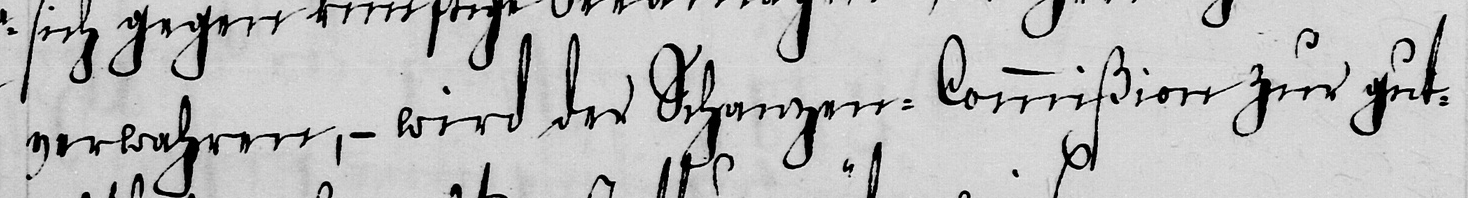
verwahren, – wird der Schanzen-Commißion zur gut¬
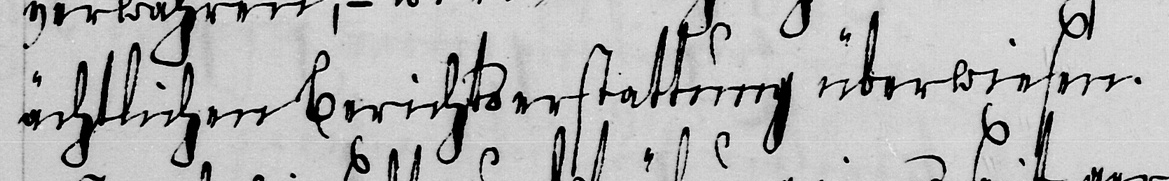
ächtlichen Berichtserstattung überwiesen.
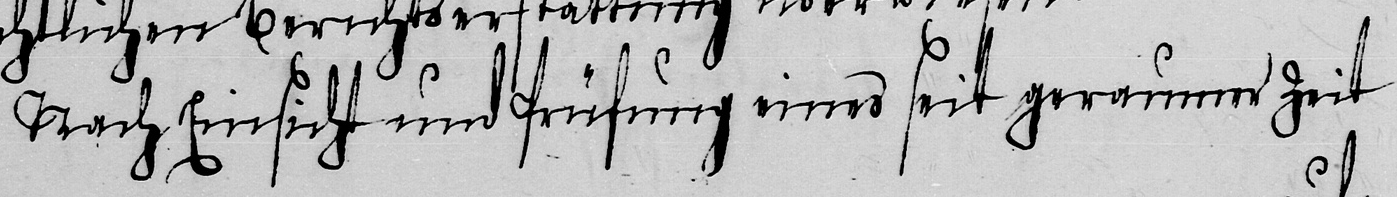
Nach Einsicht und Prüfung eines seit geraumer Zeit
